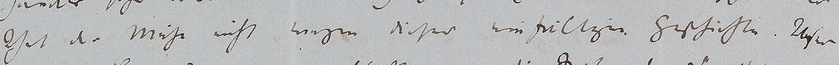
That der Mühe nicht wegen dieser einfältigen Geschichte. Unser
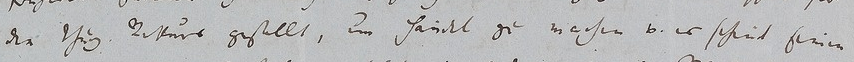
den thurg. Rekurs gestellt, um Händel zu machen &. es scheint seinen
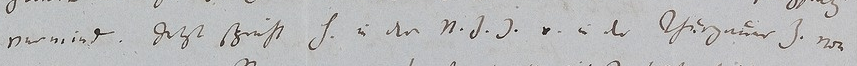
vermied. Jetzt spricht H. in der N.Z.Z. &. in der Thurgauer Z. von
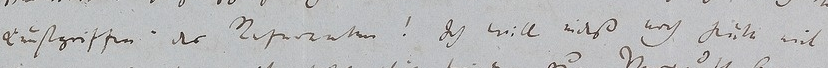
«Kunstgriffen» des Referenten! Ich will indeß noch heute mit
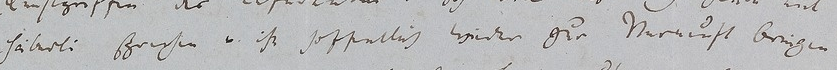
Häberli sprechen &. ihn hoffentlich wieder zur Vernunft bringen.
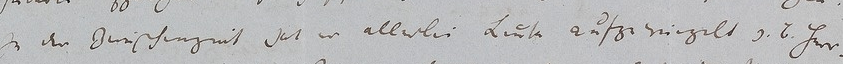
In der Zwischenzeit hat er allerlei Leute aufgewiegelt z. B. Herr-
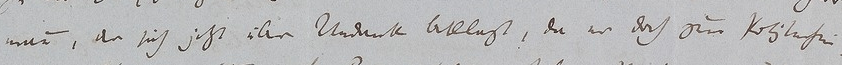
mann, der sich jetzt über Undank beklagt, da er doch zum Polytechni-
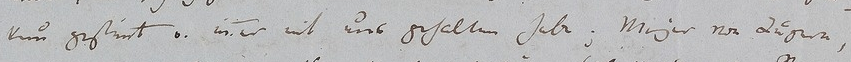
kum gestimmt &. immer mit uns gehalten habe; Mejer von Luzern,
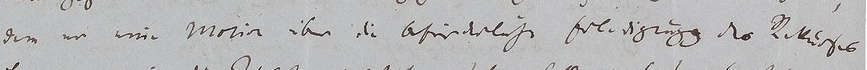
dem er eine Motion über die beförderliche Erledigung des Rekurses
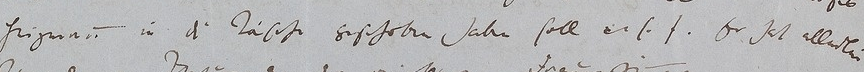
Heizmann in die Tasche geschoben haben soll u. s. f. Er hat allerlei
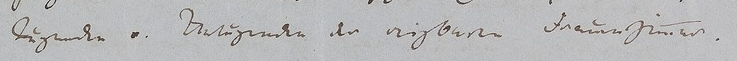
Tugenden &. Untugenden der reizbaren Frauenzimmer.
